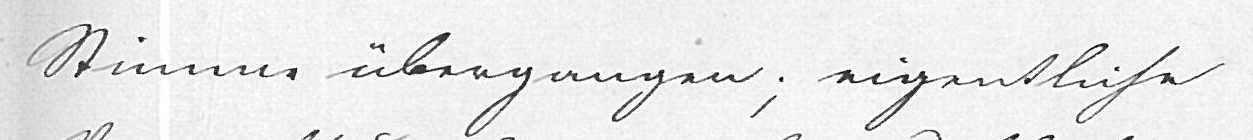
Stimme übergangen; eigentliche
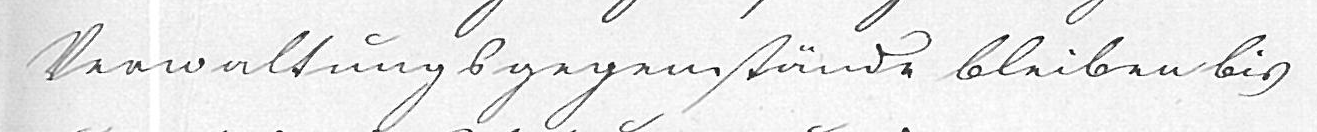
Verwaltungsgegenstände bleiben bis
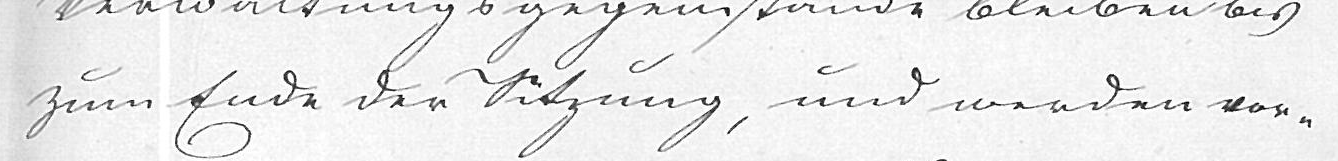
zum Ende der Sitzung, und werden vor-
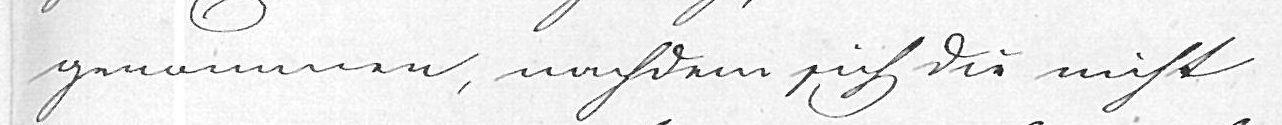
genommen, nachdem sich die nicht
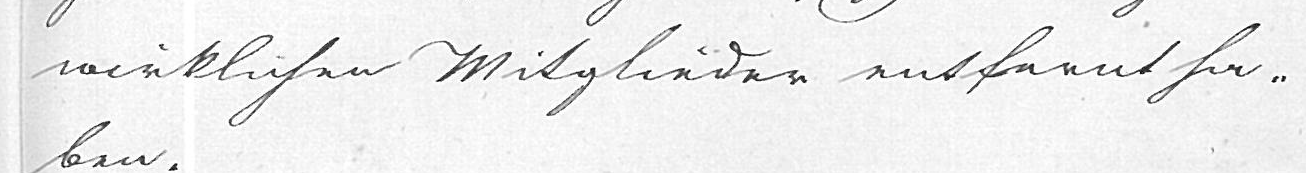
wirklichen Mitglieder entfernt ha-
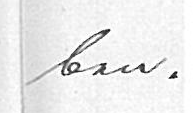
ben.
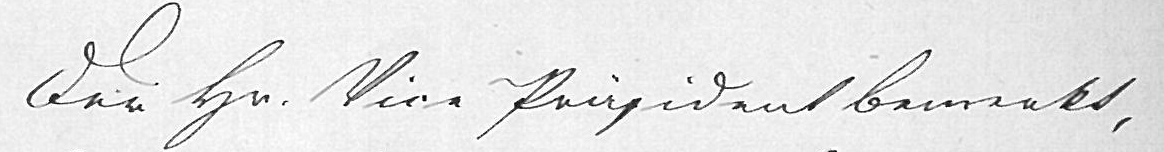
Der Hr. Vice-Präsident bemerkt,
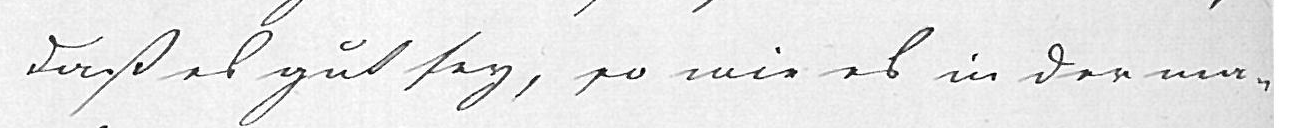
daß es gut sey, so wie es in der ma-
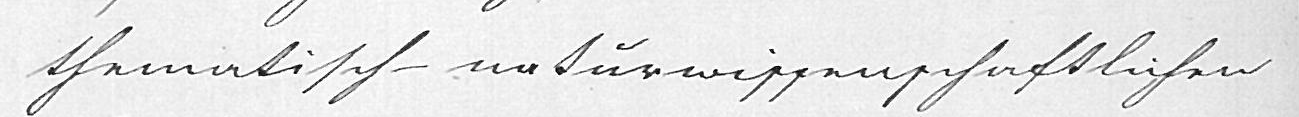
thematisch-naturwissenschaftlichen
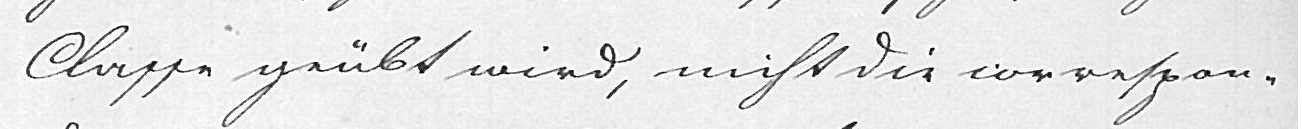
Classe geübt wird, nicht die correspon-
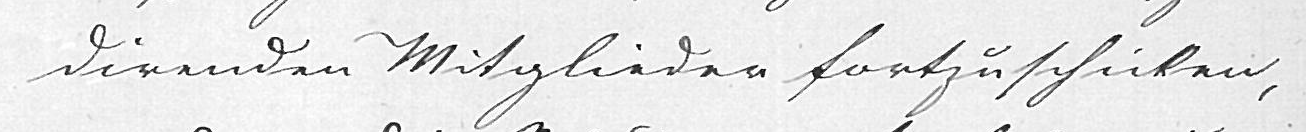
direnden Mitglieder fortzuschicken,
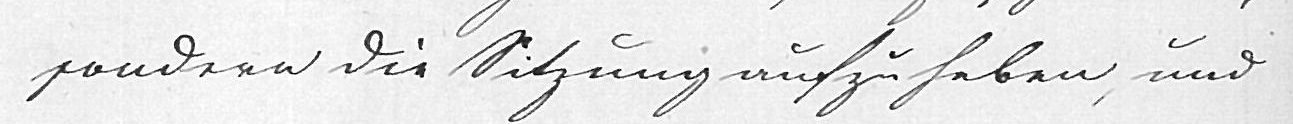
sondern die Sitzung aufzuheben, und
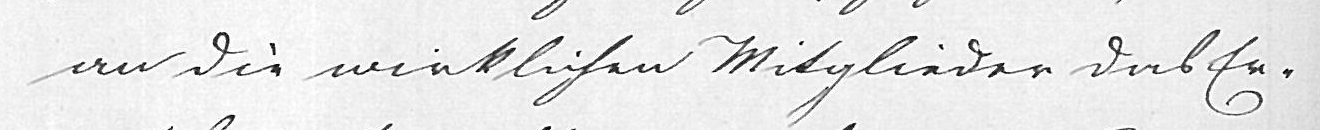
an die wirklichen Mitglieder das Er-
